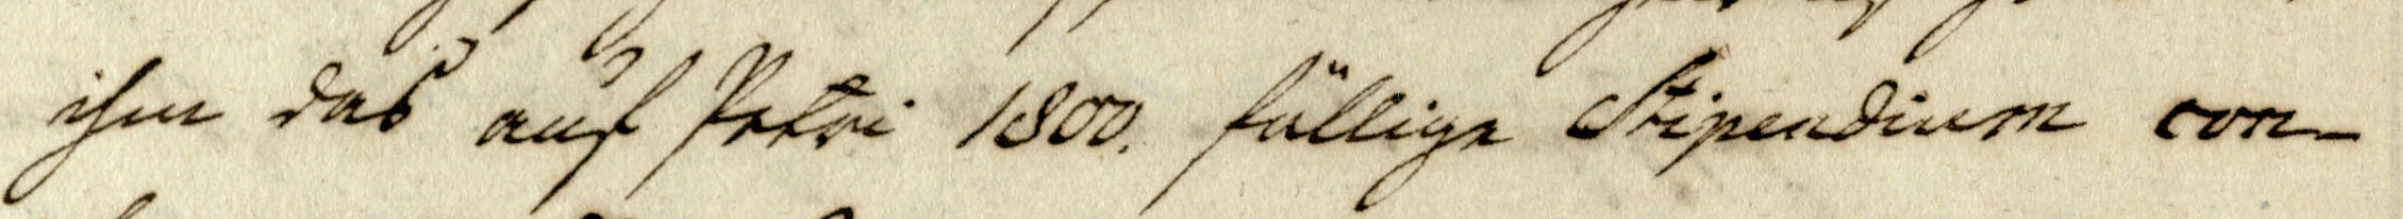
ihm das auf Petri 1800. fällige Stipendium con¬
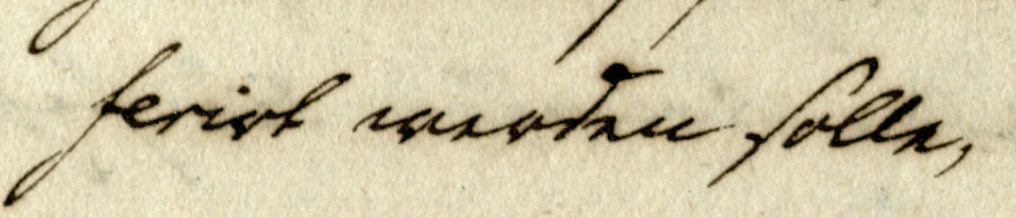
ferirt werden solle,
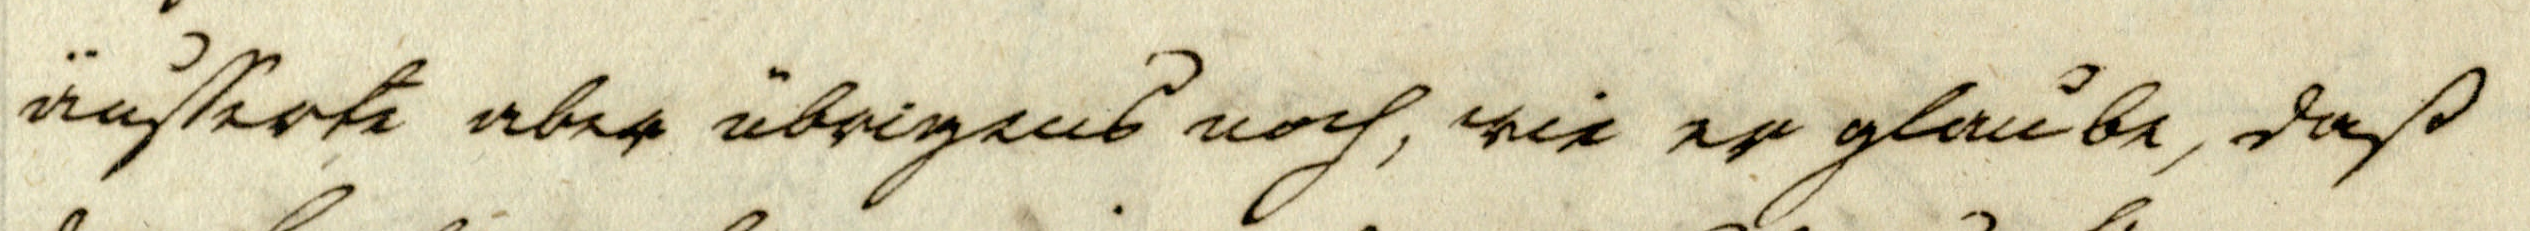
äusserte aber übrigens noch, wie er glaube, daß
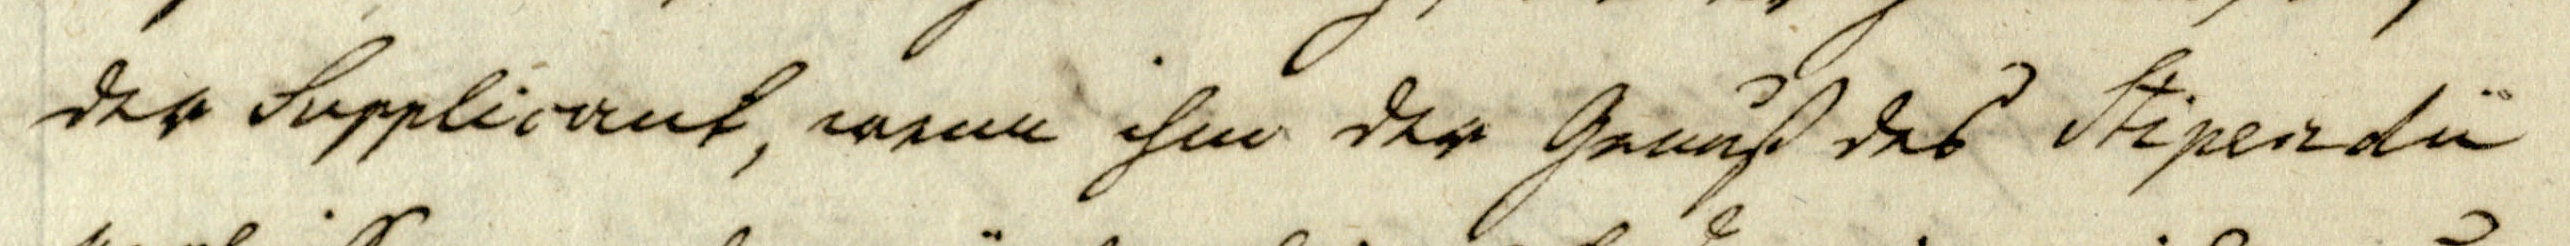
der Supplicant, wenn ihm der Genuß des Stipendii
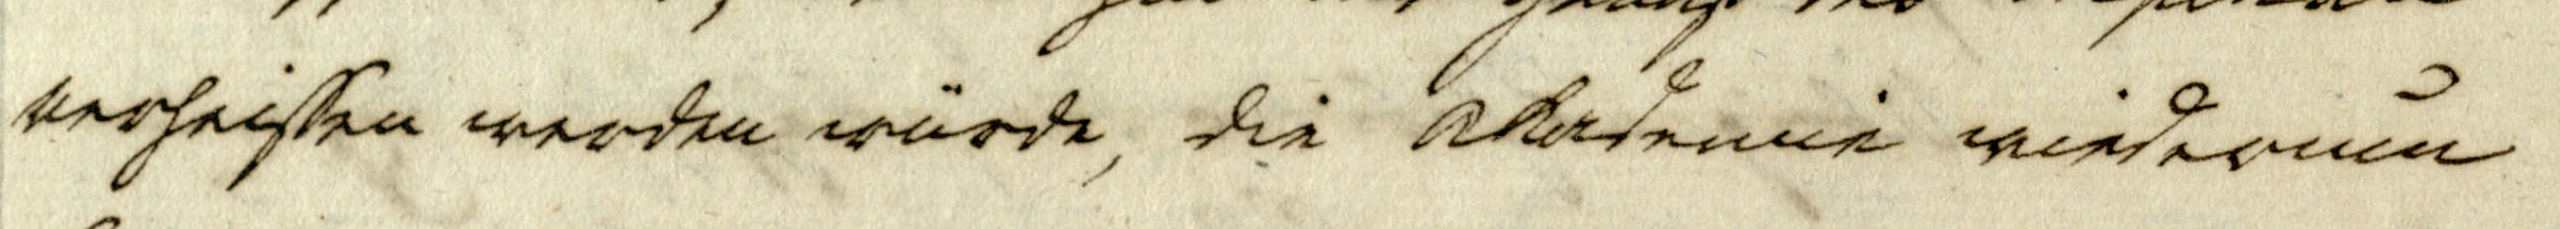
verheissen werden würde, die Akademie wiederum
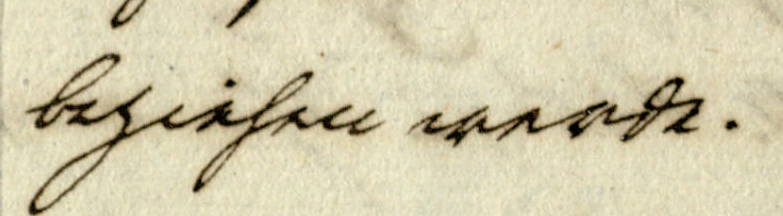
beziehen werde.
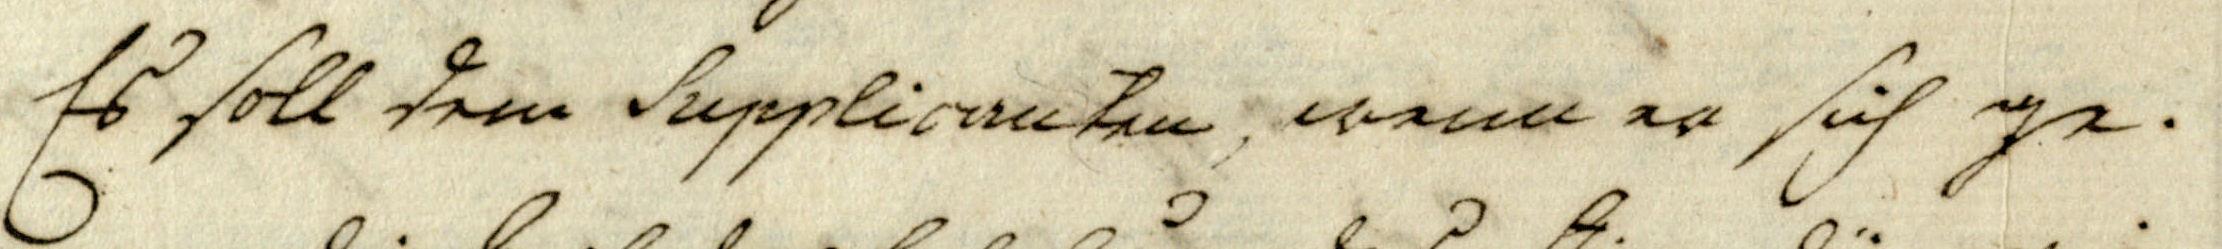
Es soll dem Supplicanten, wenn er sich ge¬
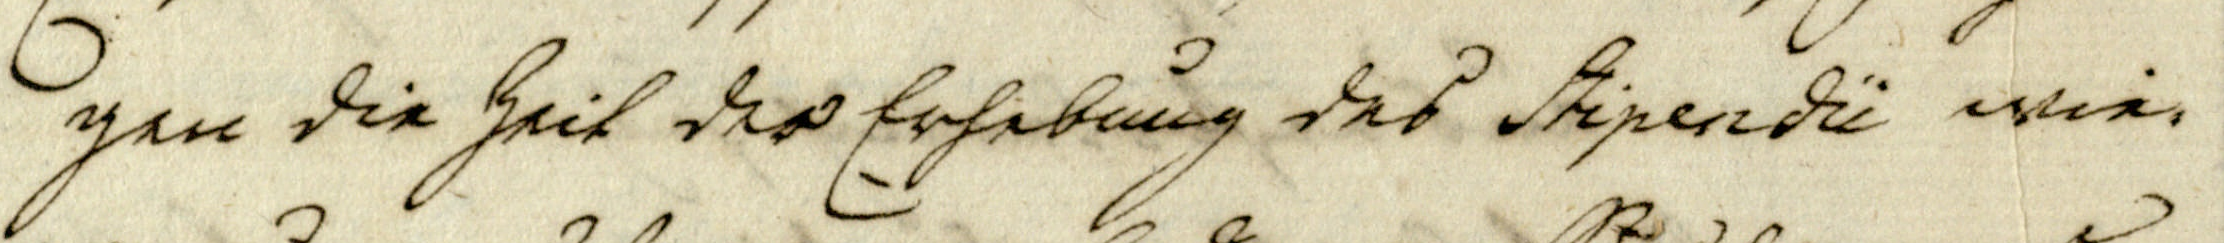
gen die Zeit der Erhebung des Stipendii wie¬
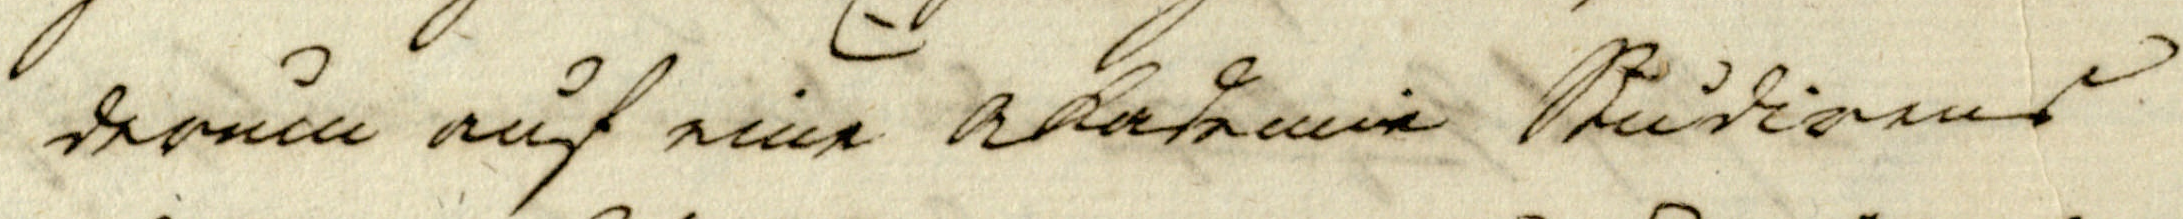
derum auf eine Akademie Studirens
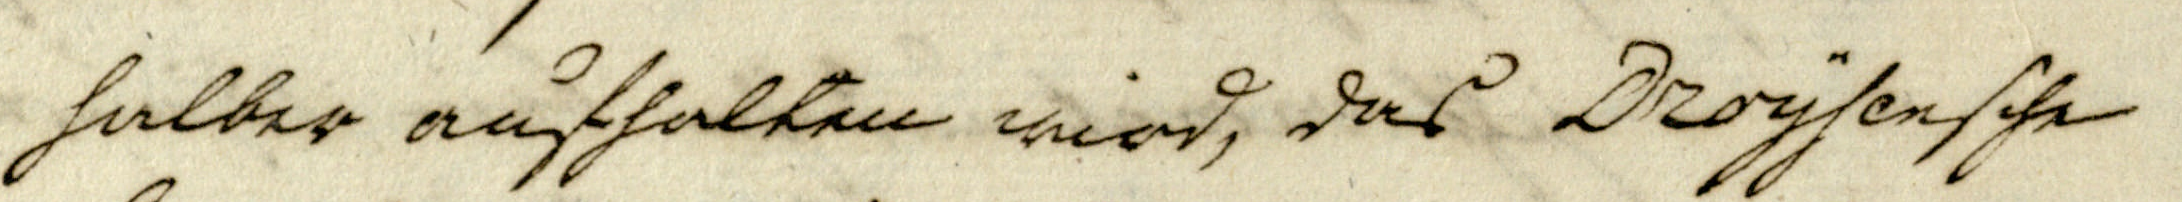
halber aufhalten wird, das Droÿsensche
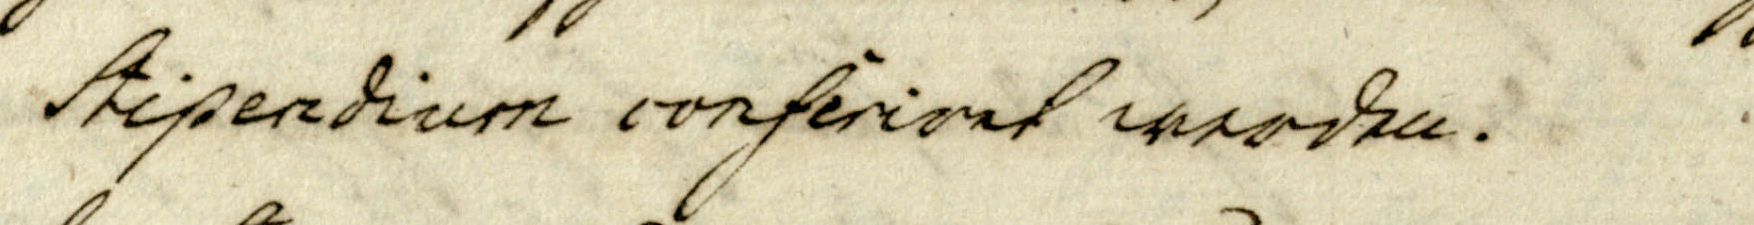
Stipendium conferiret werden.
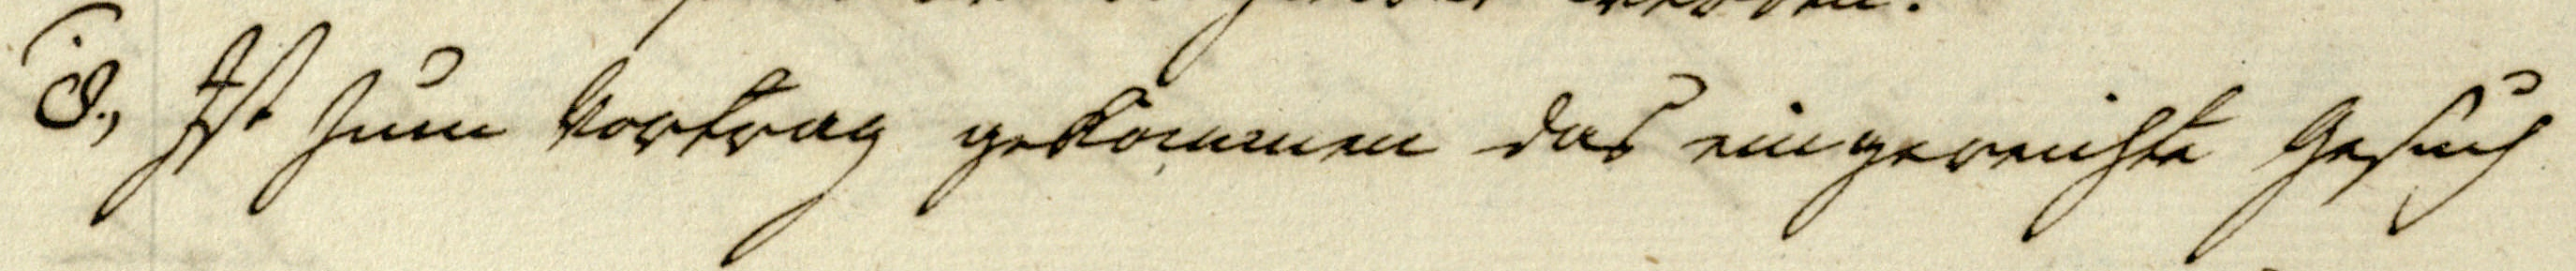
8., Ist zum Vortrag gekommen das eingereichte Gesuch
